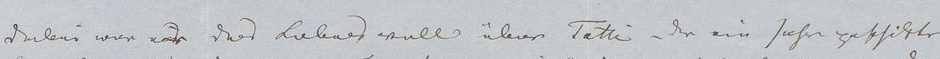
Dabei war er des Lobes voll über Tatti – der ein sehr geschikter
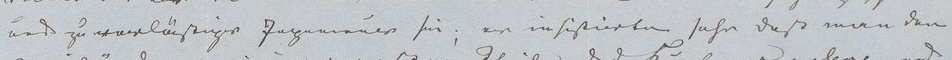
und zuverläßiger Ingenieur sei; er insistirte sehr daß man den
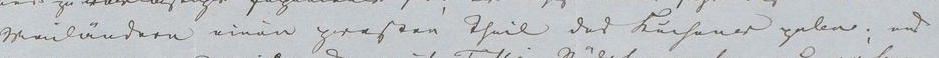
Mailändern einen großen Theil des Kuchens gebe; und
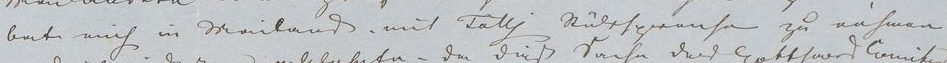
bat mich in Mailand – mit Tattj Rüksprache zu nehmen
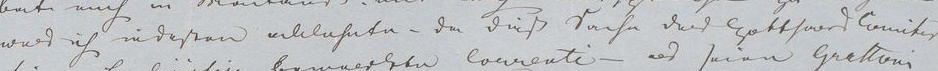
was ich indeßen ablehnte – da dieß Sache des Gotthard Comites
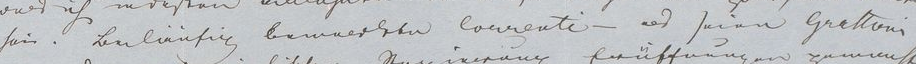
sei. Beiläufig bemerkte Correnti – es seien Grattoni
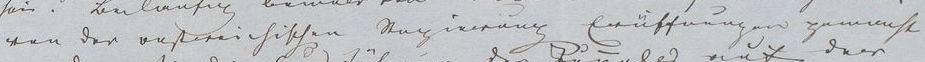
von der oestreichischen Regierung Eröffnungen gemacht
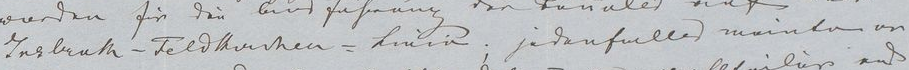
Insbruk–Feldkirchen -Linie; jedenfalls meinte er
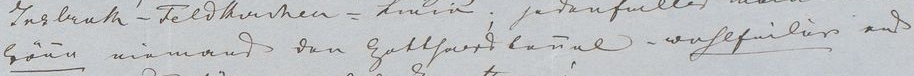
könne niemand den Gotthardtunnel – wohlfeiler und
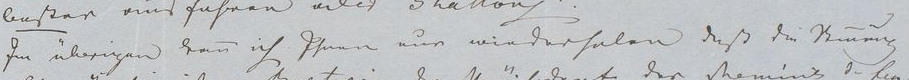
Im übrigen kann ich Ihnen nur wiederholen daß die Stimmung
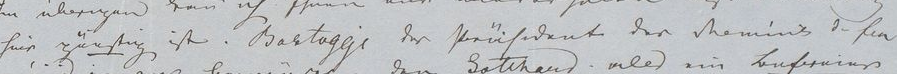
hier günstig ist. Bastoggi der Präsident der chemins de fer
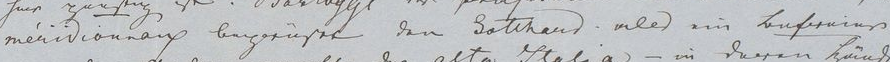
méridionnaux begrüßt den Gotthard als ein Befreier
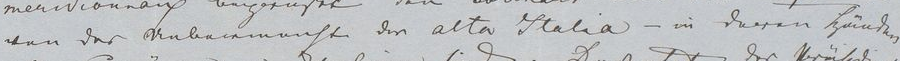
von der Uebermacht der alta Italia – in deren Händen
